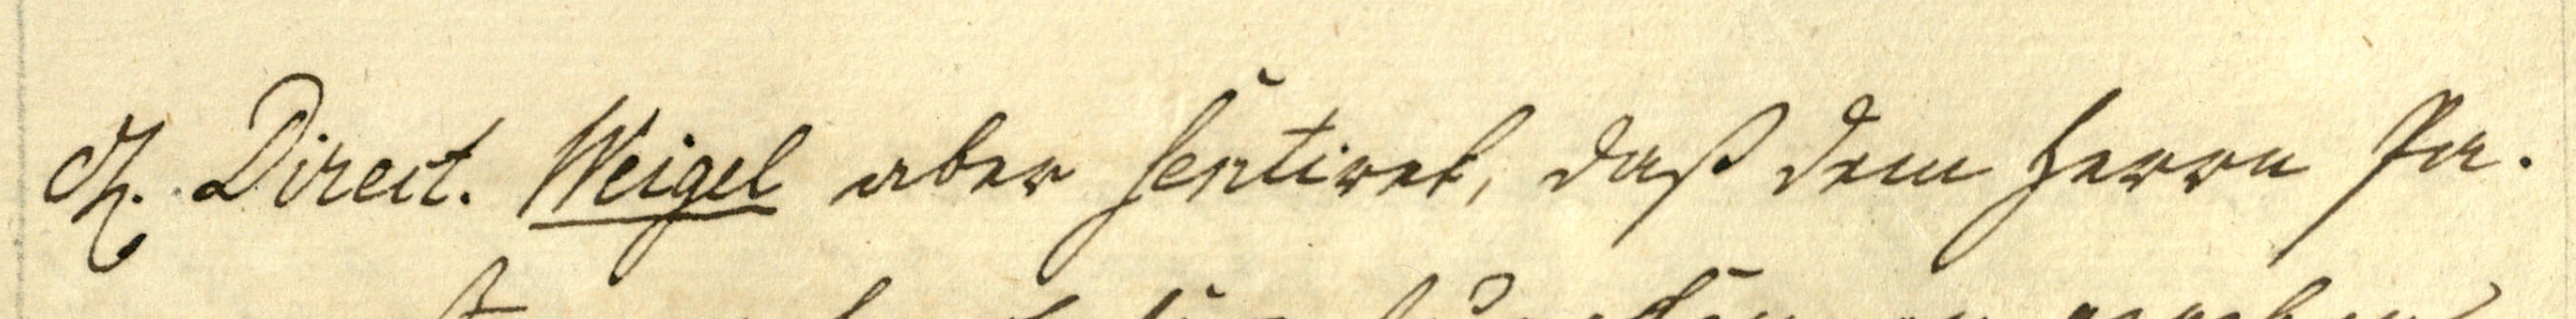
dh. Direct. Weigel aber sentiret, daß dem Herrn Pa¬
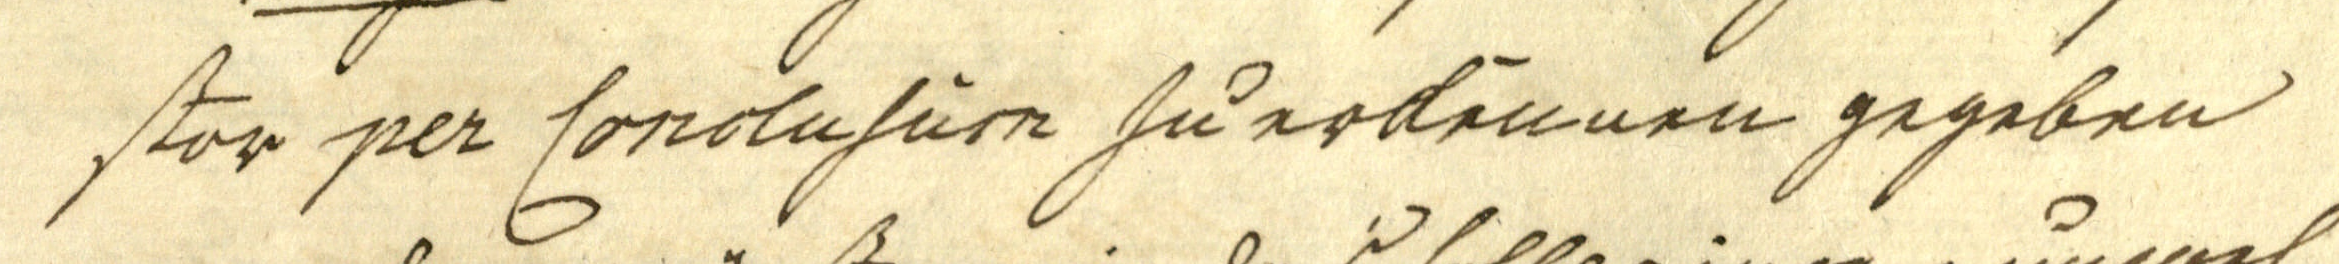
stor per Conclusum zu erkennen gegeben
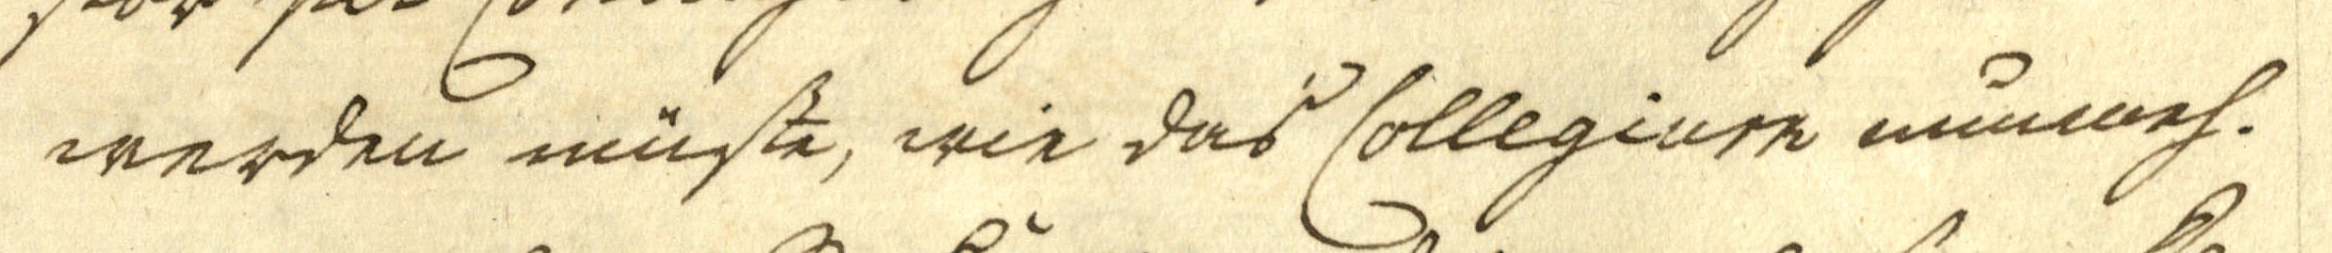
werden müßte, wie das Collegium nunmeh¬
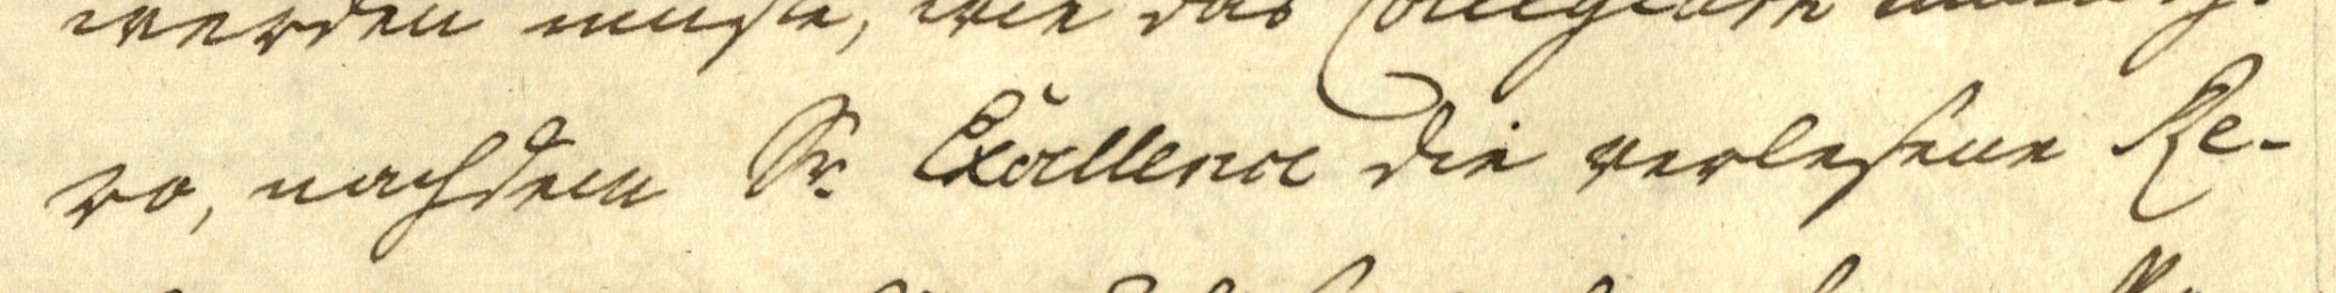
ro, nachdem Sr Excellence die verlesene Re¬
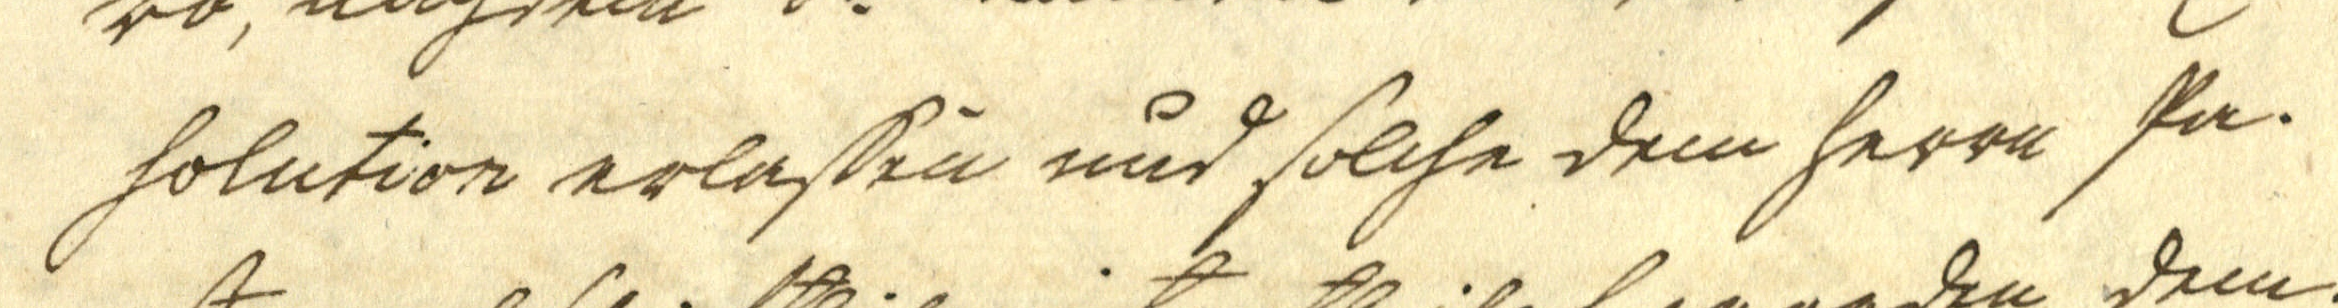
solution erlassen und solche dem Herrn Pa¬
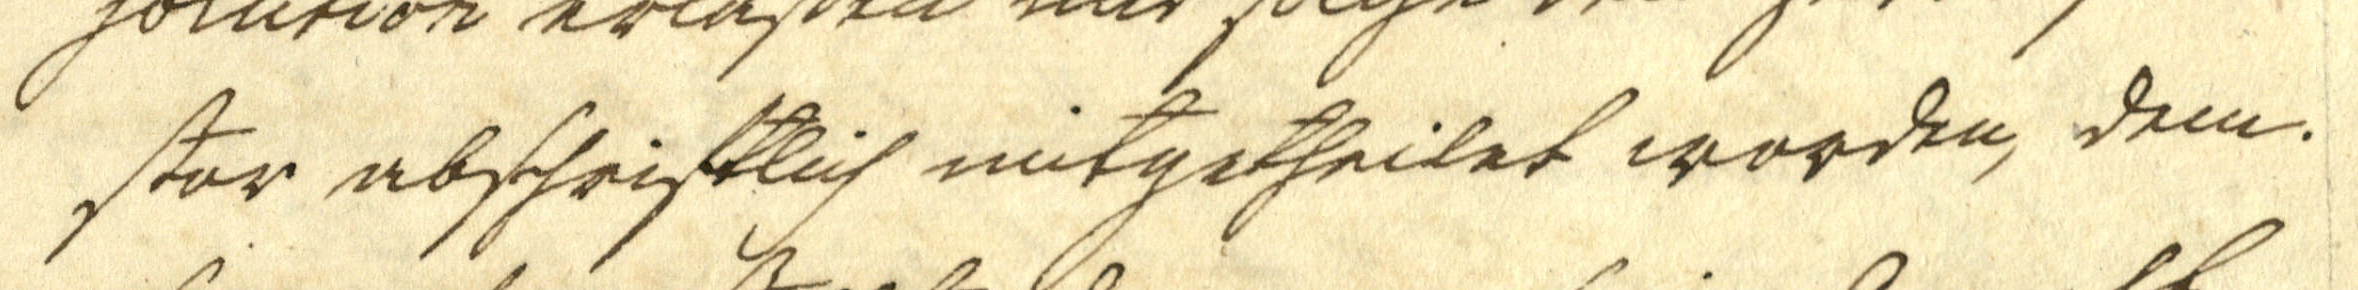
stor abschriftlich mitgetheilet worden, dem¬
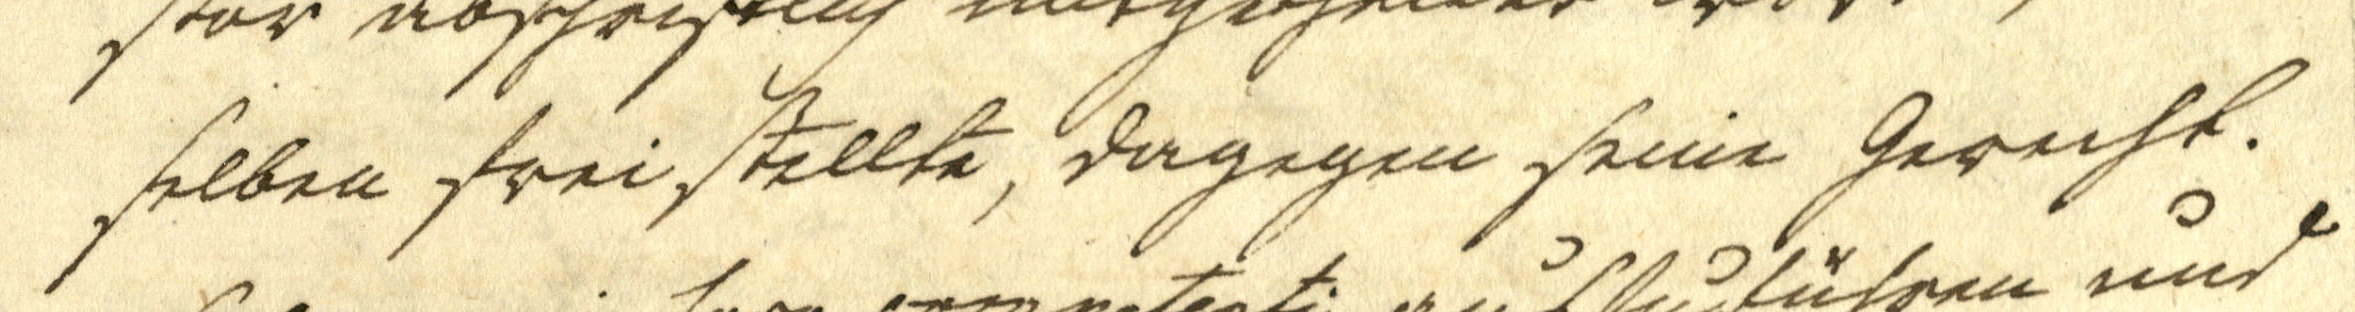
selben frei stellet, dagegen seine Gerecht¬
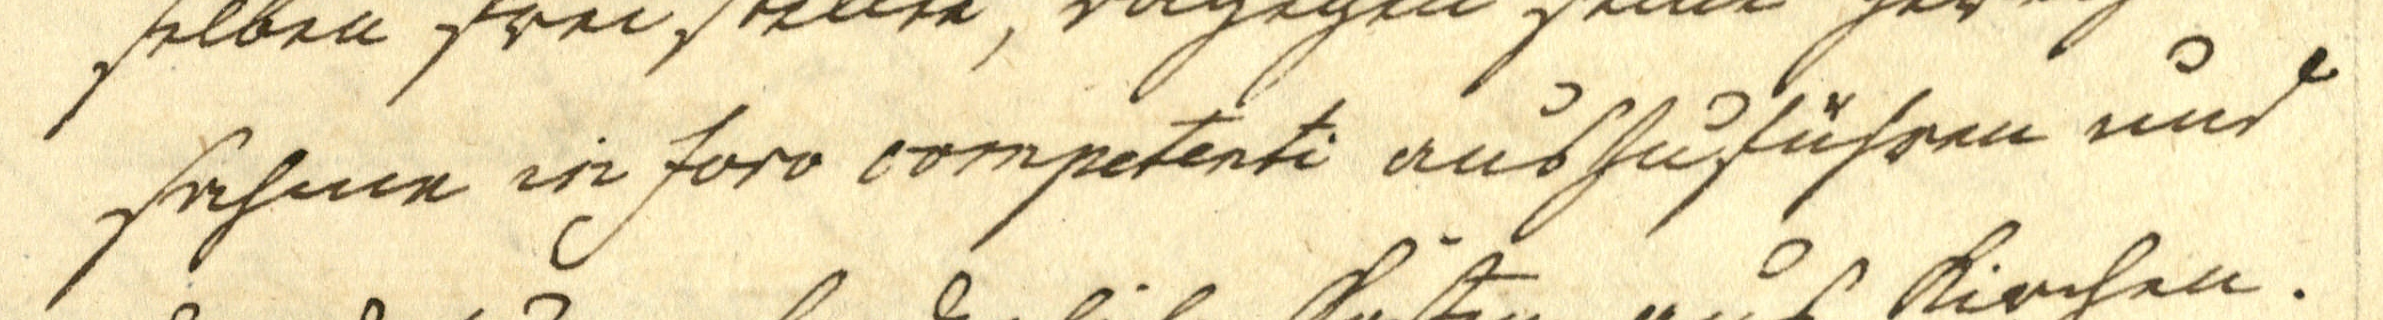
sahme in foro competenti auszuführen und
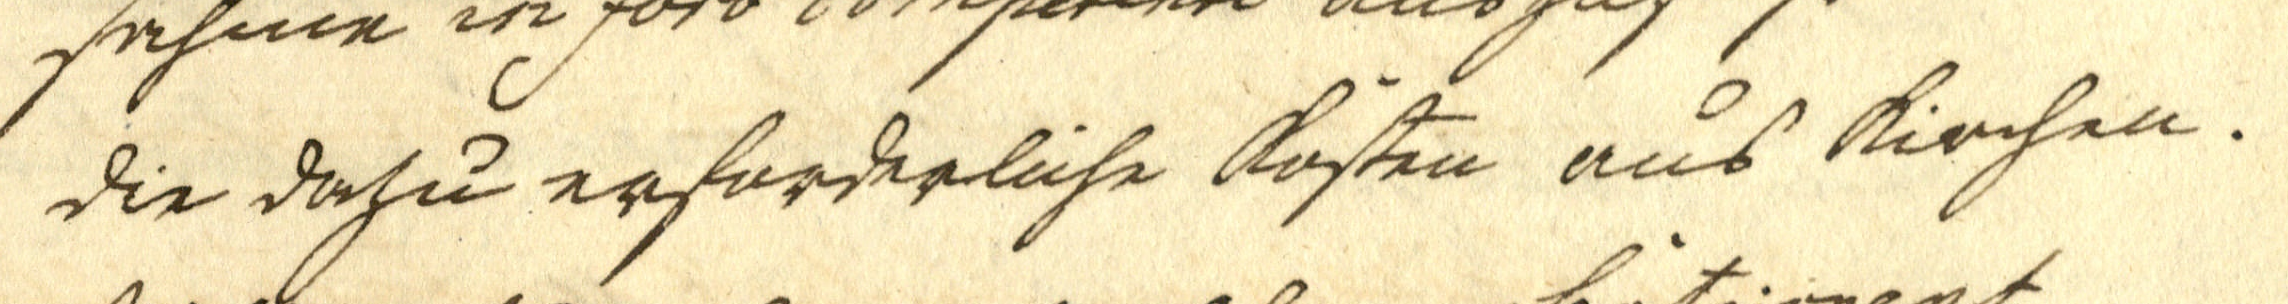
die dazu erforderlichen Kosten aus Kirchen¬
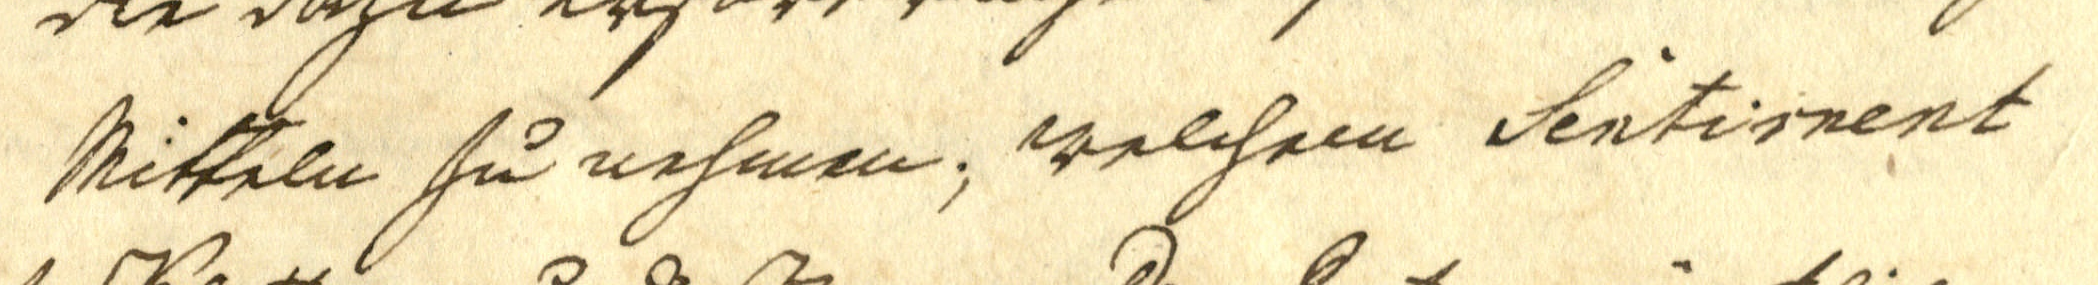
Mittelm zu nehmen, welchem Sentiment
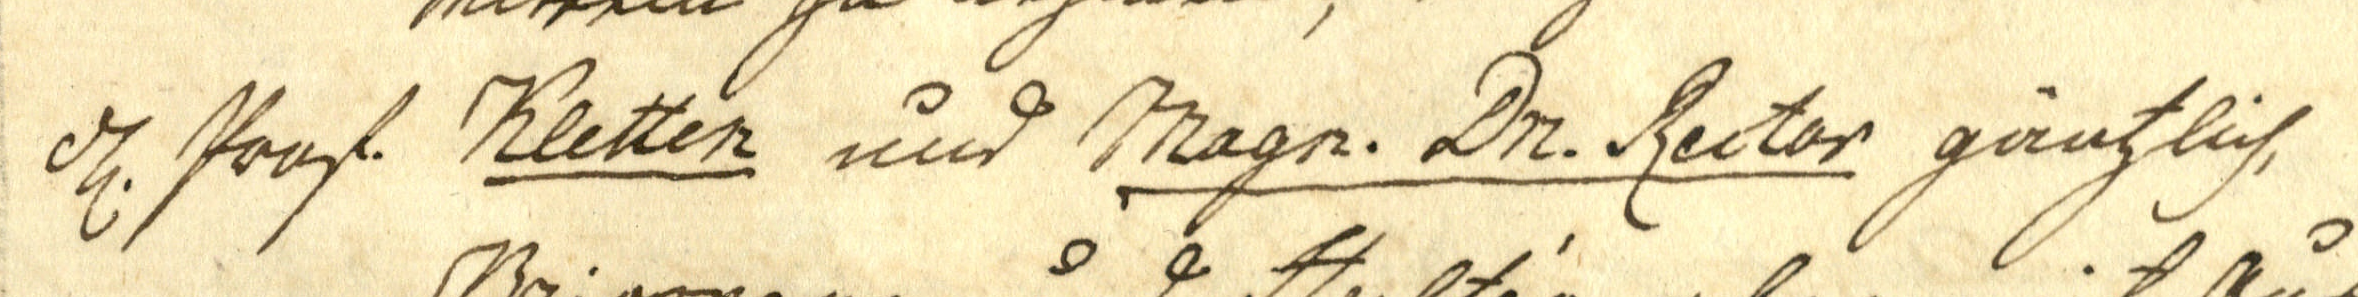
dh. Prof. Kletten und Magn. Dn. Rector gäntzlich,
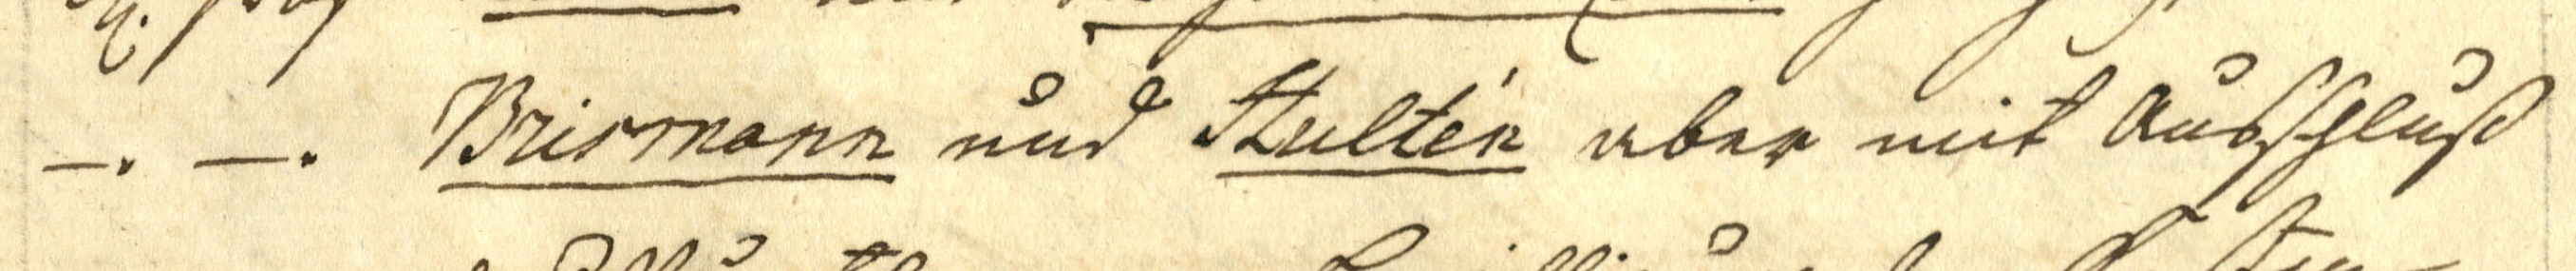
Brismann und Hultén aber mit Ausschluß
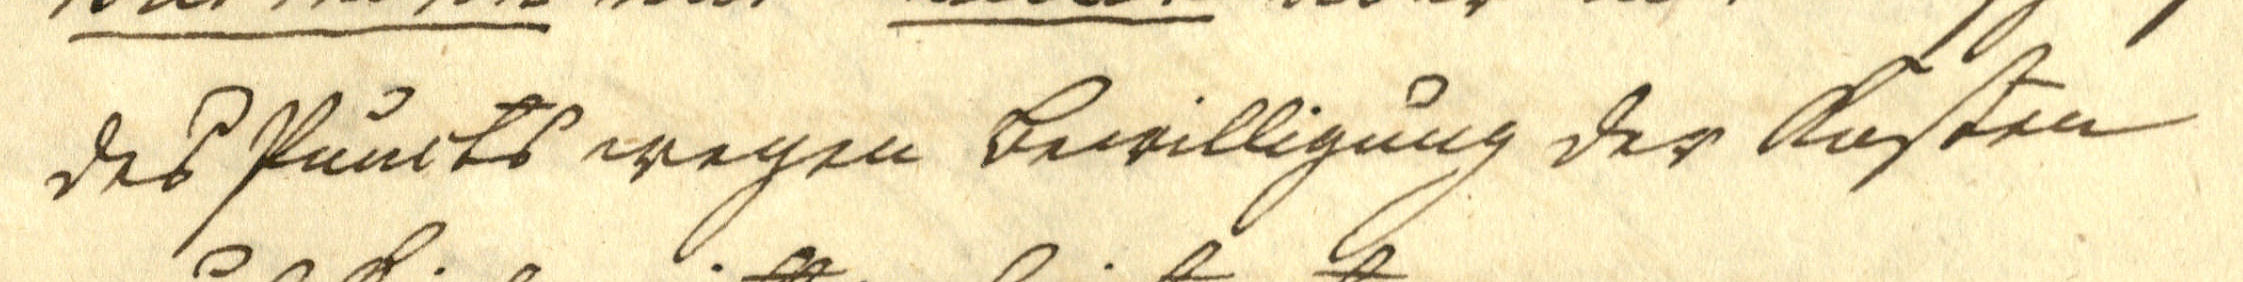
des Puncts wegen Bewilligung der Kosten
